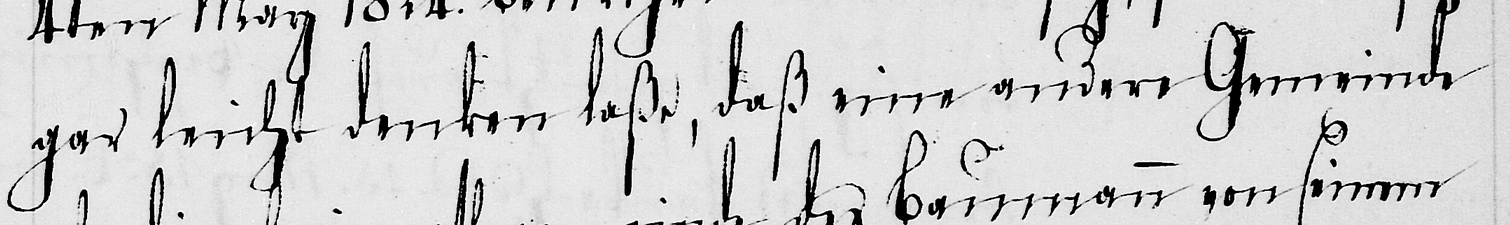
gar leicht denken laße, daß eine andere Gemeinde
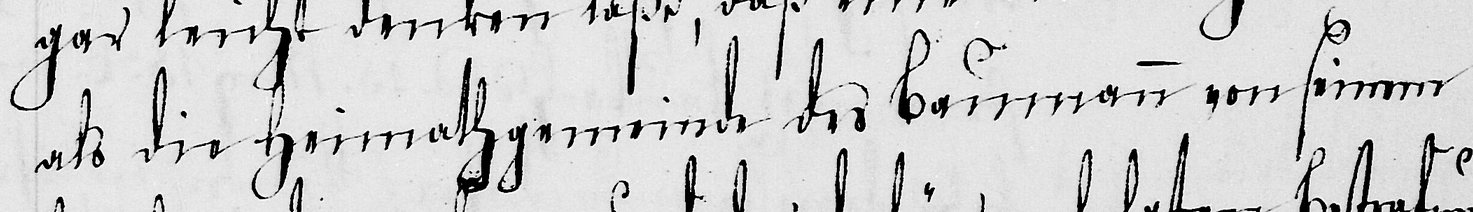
als die Heimathgemeinde des Baumann von seinem
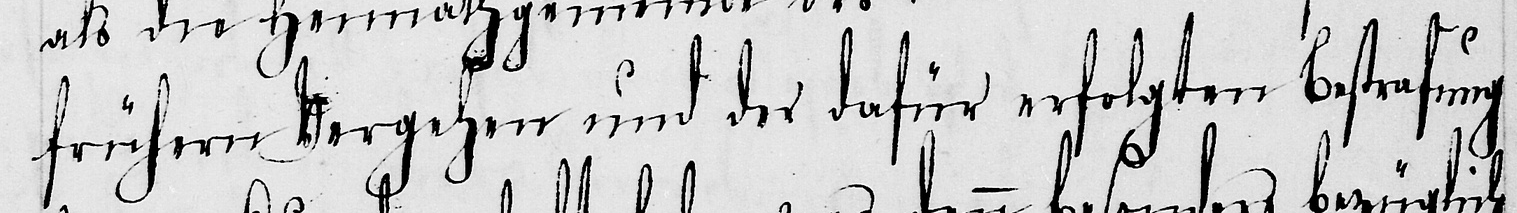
frühern Vergehen und der dafür erfolgten Bestrafung
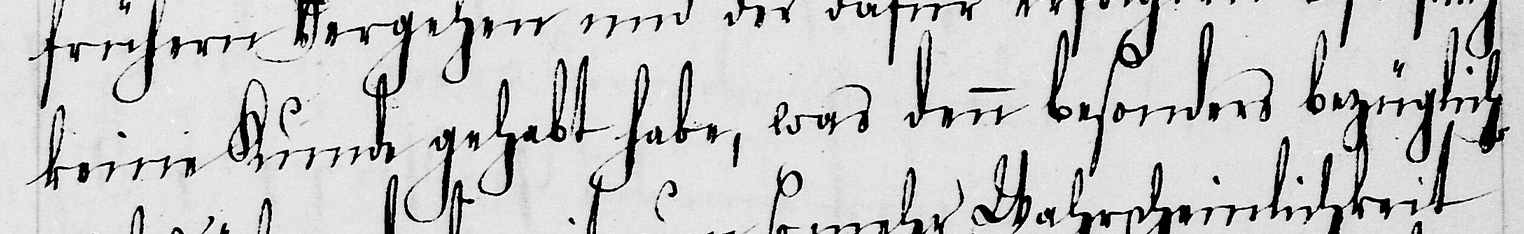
keine Kunde gehabt habe, was denn besonders bezüglich
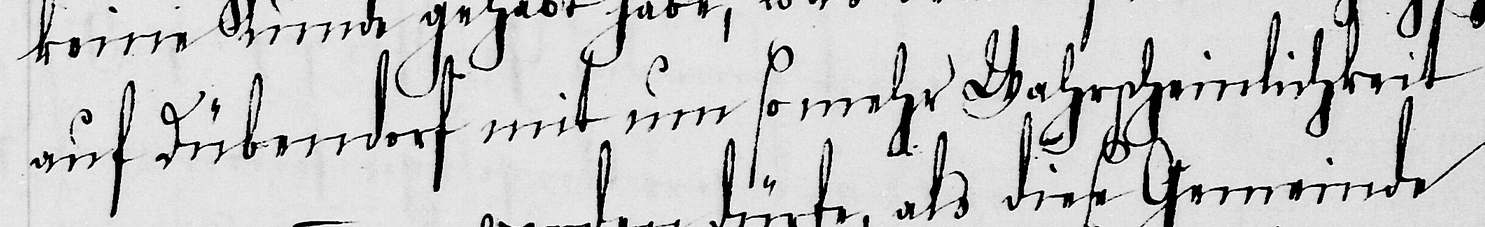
auf Dübendorf mit um so mehr Wahrscheinlichkeit
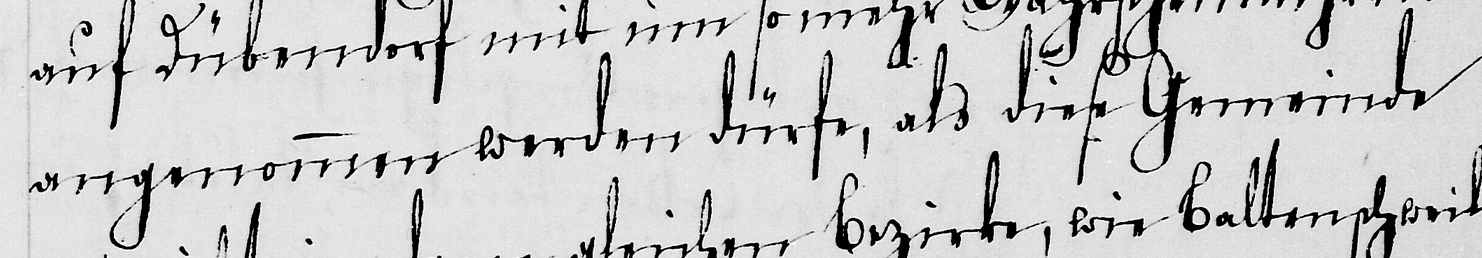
angenommen werden dürfe, als diese Gemeinde
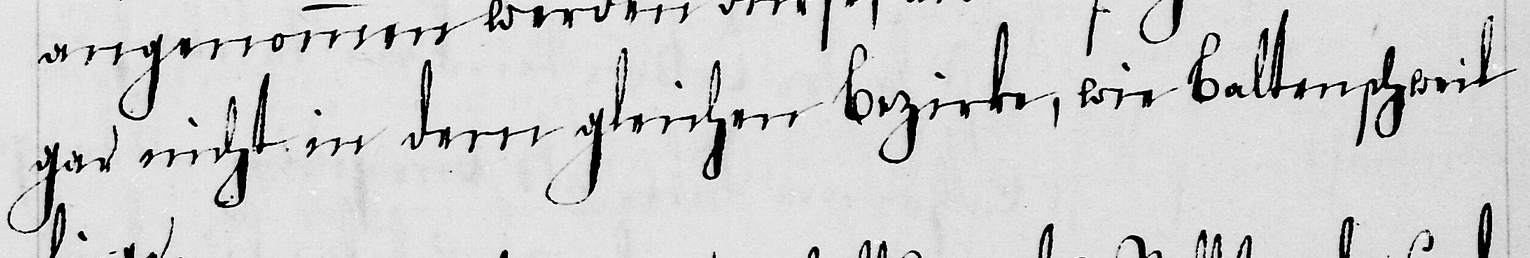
gar nicht in dem gleichen Bezirke, wie Baltenschweil
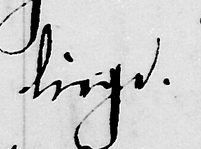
liege.
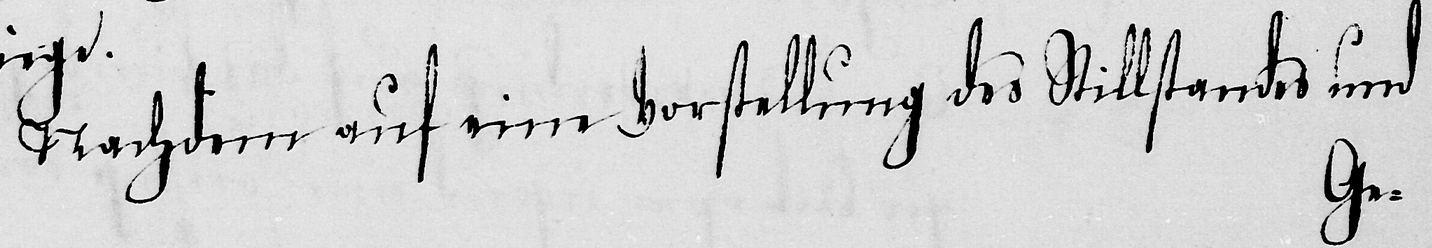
Nachdem auf eine Vorstellung des Stillstandes und
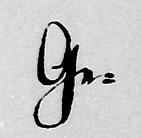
Ge¬
